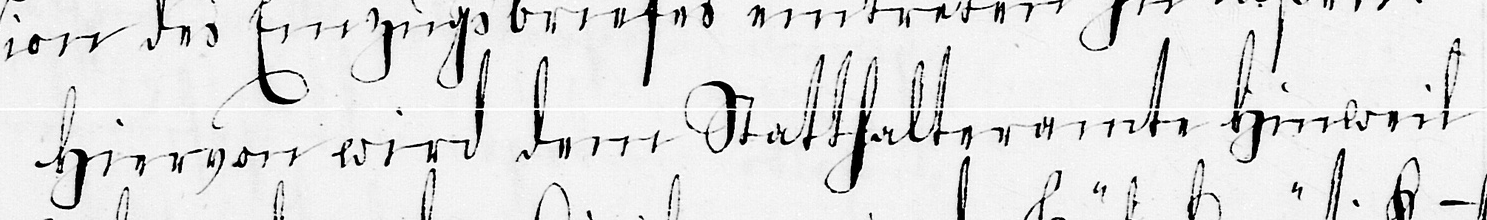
Hiervon wird dem Statthalteramte Hinweil
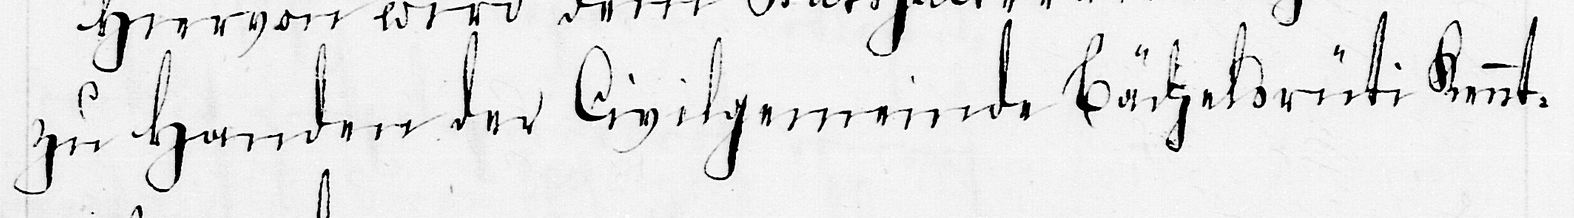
zu Handen der Civilgemeinde Bächelsrüti Kennt¬
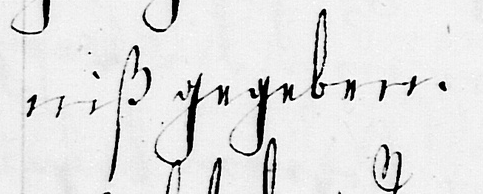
niß gegeben.
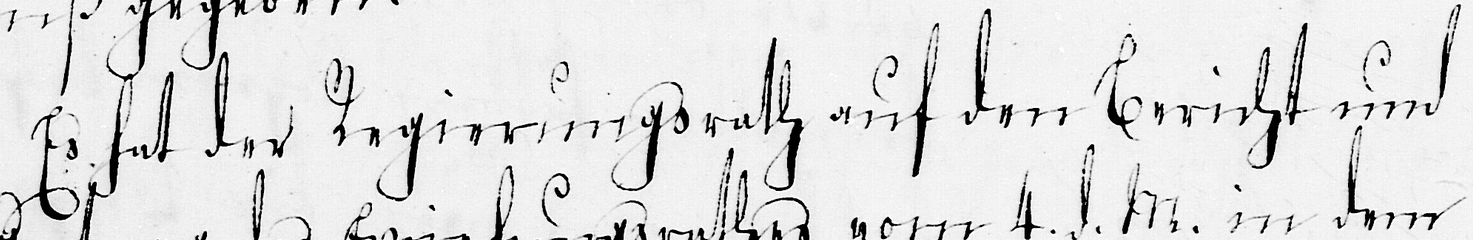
Es hat der Regierungsrath auf den Bericht und
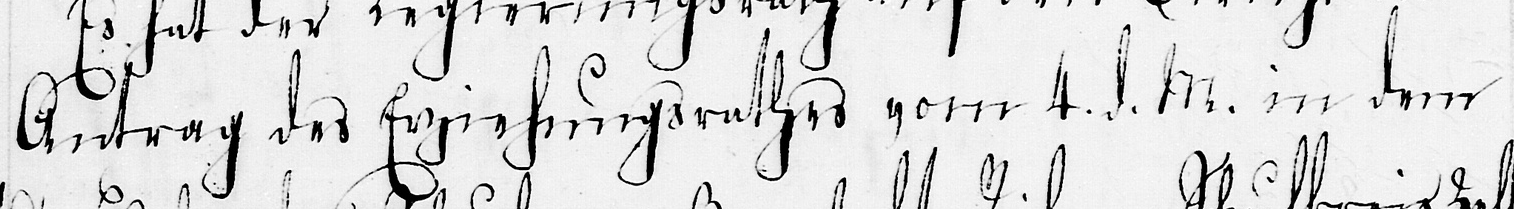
Antrag des Erziehungsrathes vom 4. d. M. in dem
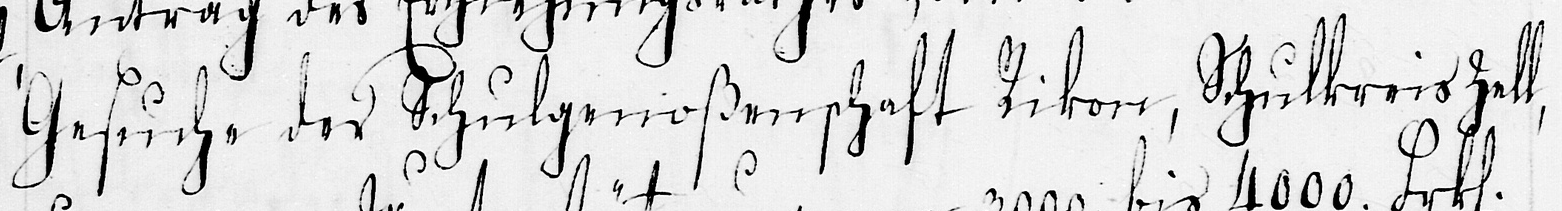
Gesuche der Schulgenoßenschaft Rikon, Schulkreis Zel¬
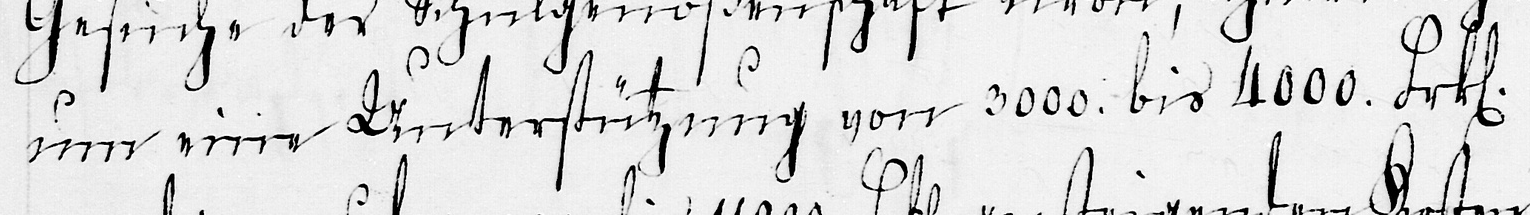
um eine Unterstützung von 3000. bis 4000. Frk[e¬
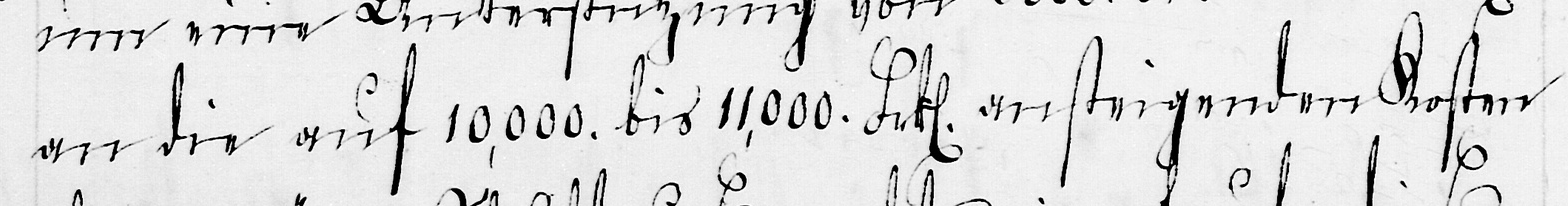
an die auf 10,000. bis 11,000. Frk[en]. ansteigenden Kosten
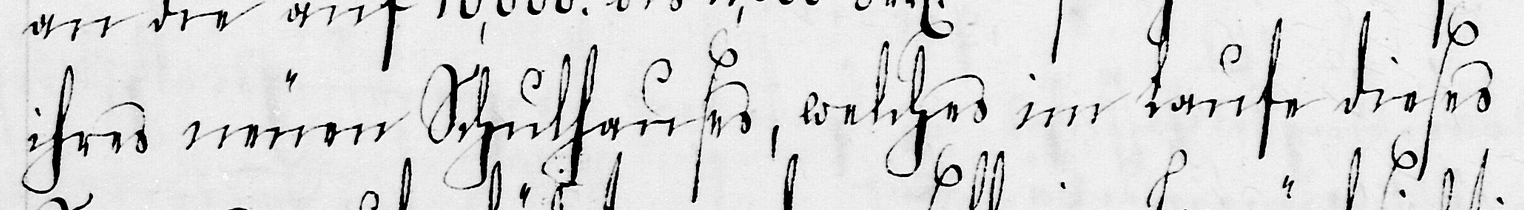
ihres neuen Schulhauses, welches im Laufe dieses
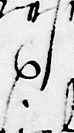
n].
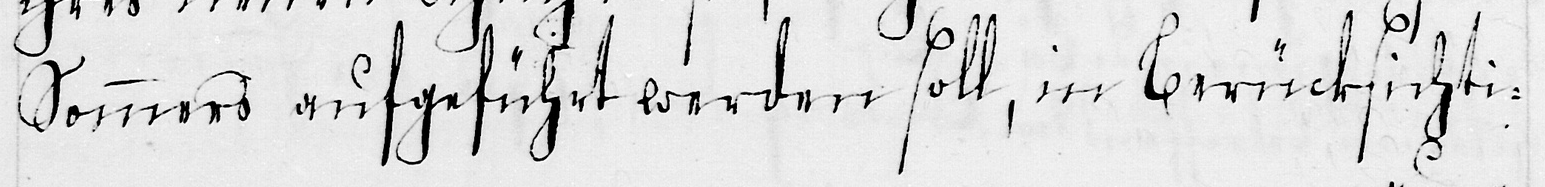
Sommers aufgeführt werden soll, in Berücksichti-
